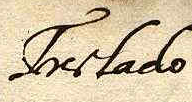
Treslado
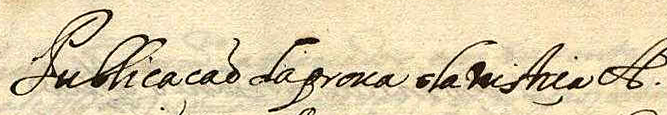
Publicaçaõ da proua da iustiça A.
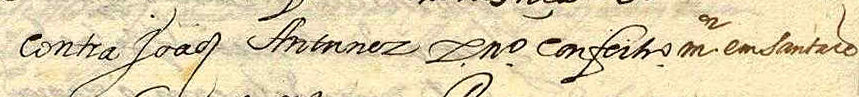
contra Joaõ Antunez x. n.o confeitr.o m.or em santarē
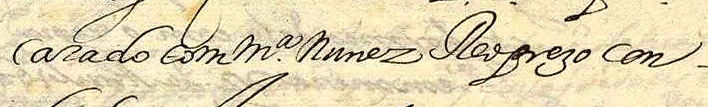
cazado com m.a nunez Reo prezo con
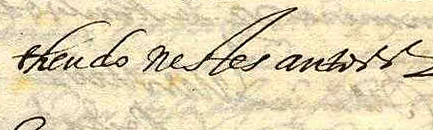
theudo nestes autos
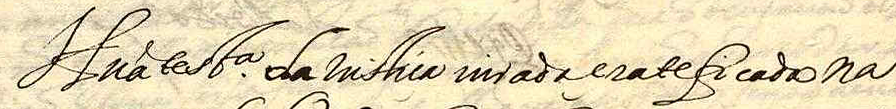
Huā test.a da iustiça iurada e rateficada na
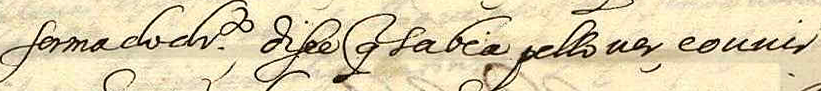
forma do dr.to, disse q̄ sabia pello uer, e ouuir
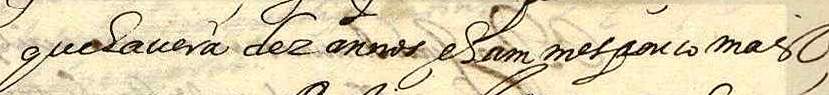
que hauerá dez annos e hum mes pouco mais,
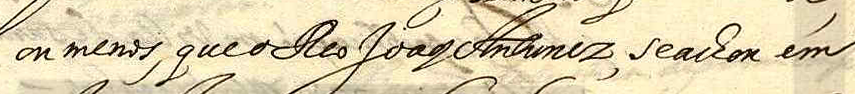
ou menos, que o Reo Joaõ Antunez, se achou em
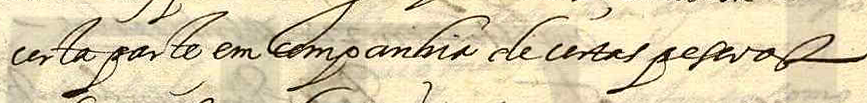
certa parte em companhia de certas pessoas
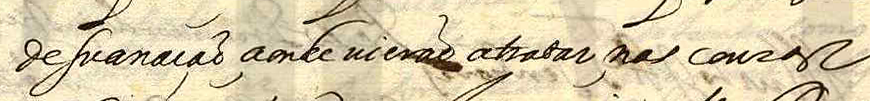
de sua naçaõ aonde uieraõ a tratar nas couzas
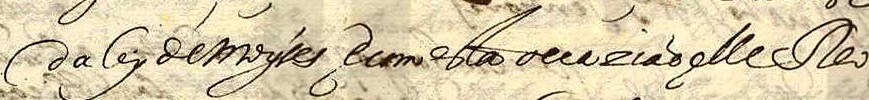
da ley de moyses, e com esta occaziaõ elle Reo
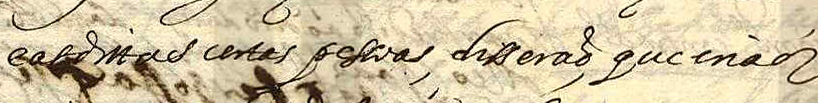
e as dittas certas pessoas, disseraõ, que criaõ
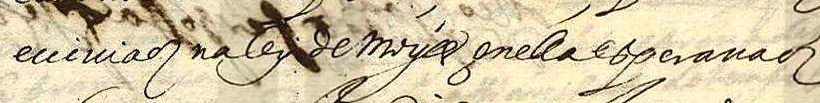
e uiuiaõ na ley de moyses e nella esperauaõ
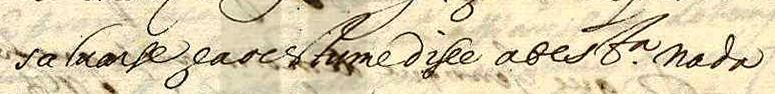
saluarse e ao costume disse a test.a nada
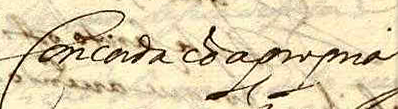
Concorda cō a propria
